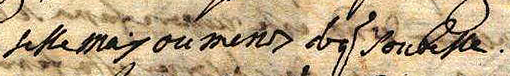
sesse mais ou menos do q̄ soubesse.
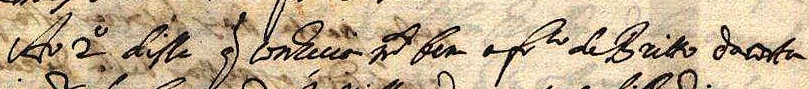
Ao 2o disse q̄ conhecia mto bem a frco de Britto da costa
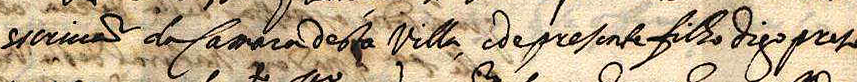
Escriuaõ da Camara desta Villa, e de presente filho digo preso
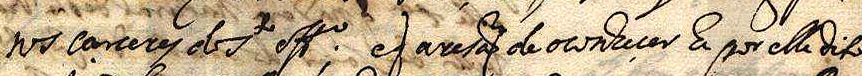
nos carceres do sto offo. e q̄ a resaõ de o conhecer he por elle dito
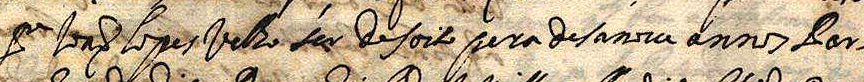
pe Ioaõ lopes Velho ser desoito pera desanoue annos Par
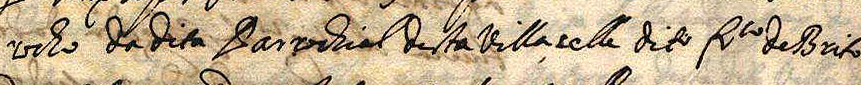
rocho da dita Parrochial desta Villa e elle dito frco de Brito
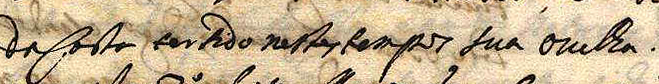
da Costa ter sido nestes tempos sua ouelha.
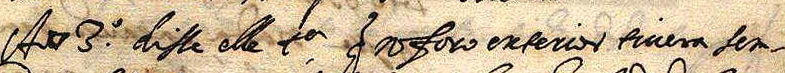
Aos 3o. disse elle ta, q̄ no foro exterior tiuera sem
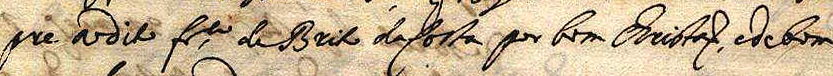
pre ao dito fr,co de Brito da Costa por bom christaõ, e de bom
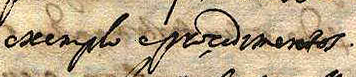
exemplo, e procedimentos.
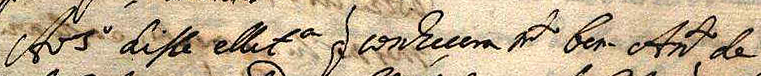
Ao 5o disse elle ta q̄ conhecera mto bem Anto de
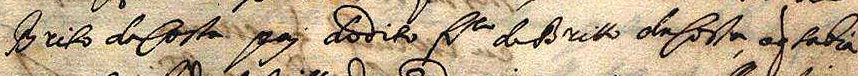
Brito da Costa paj do dito frco de Britto da Costa, e q̄ sabia
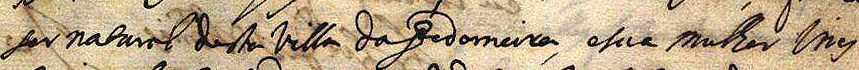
ser natural desta Villa da pedorneira, e sua mulher Ines
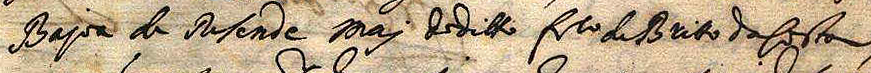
Bajoa de Resende maj do ditto frco de Britto da Costa
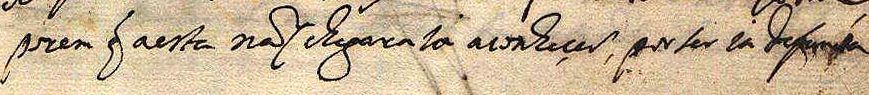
porem q̄ a esta naõ chegara ia a conhecer, por ser ia defunta
